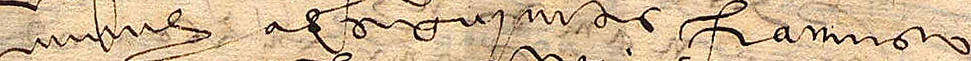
munhas segujmtes framcisco
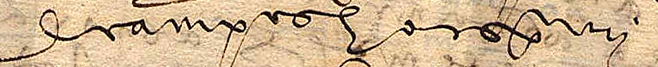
de campos ho esp̄uy
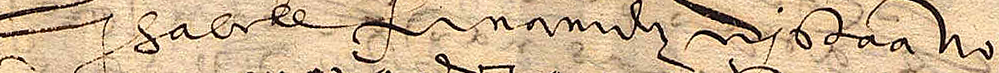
item Jsabell fernamdez crjstaā no
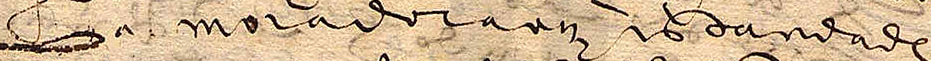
va moradora em esta cidade
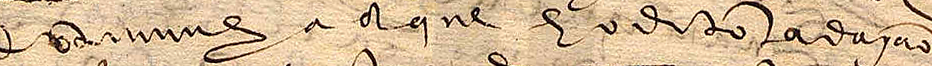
testemunha A que ho dito adayão
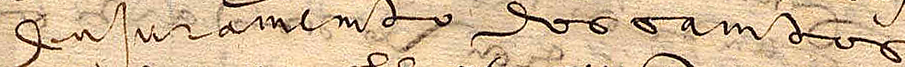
deu Juramemto dos samtos
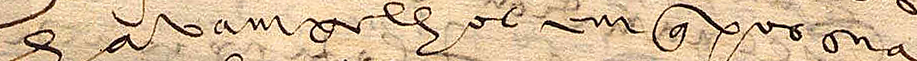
havamgelhos em q̄ pos sua
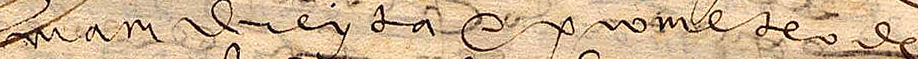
mam dereyta e prometeo de
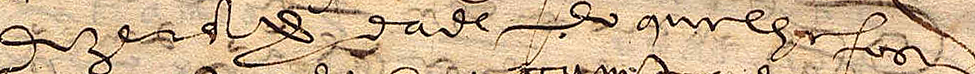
dizer A ꝟdade do que lhe fose
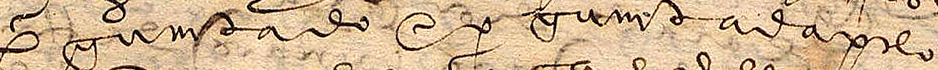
ꝑgumtado e ꝑgumtada pelo
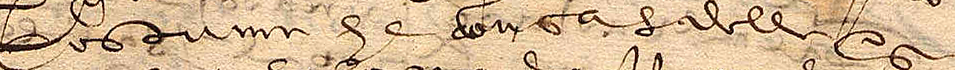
Costume he cousas delle e se
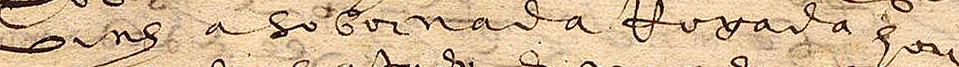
vinha asobornada Rogada hou
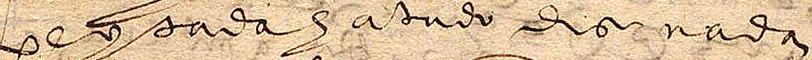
peytada ha tudo dise nada
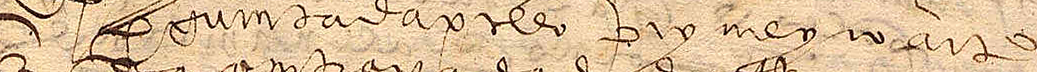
item ꝑgumtada pello prymeyro arto
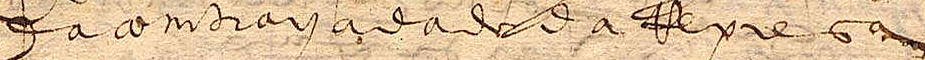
da comtrarjadade da Re presa
